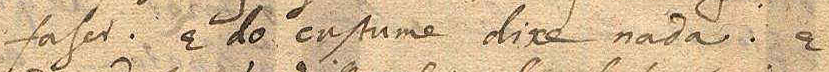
faser. E do custume dixe nada. E
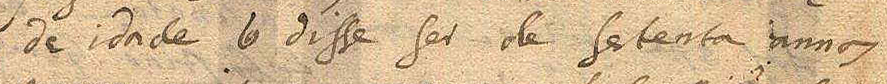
de idade q̄ disse ser de setenta annos
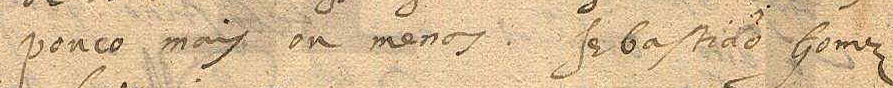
pouco mais ou menos. Sebastiaõ Gomez
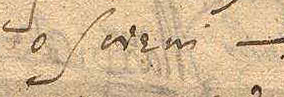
o screui -
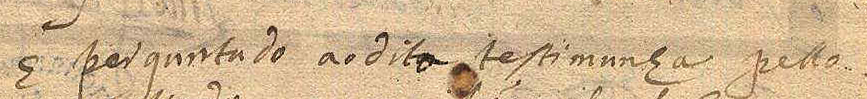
E perguntado ao dito testimunha pello
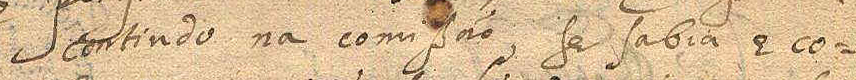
contiudo na comissaõ, se sabia E co
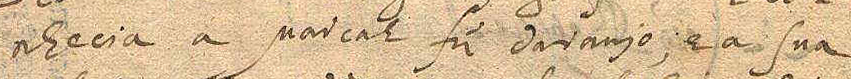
nhecia a Marçal frz̄ daraujo, E a sua
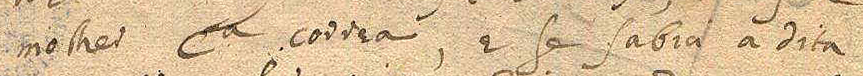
molher Ca correa, E se sabia a dita
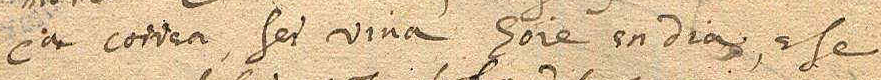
Ca correa, ser viua hoie Em dia, E se
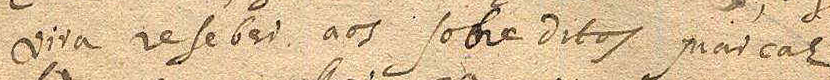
vira reseber aos sobreditos Marçal
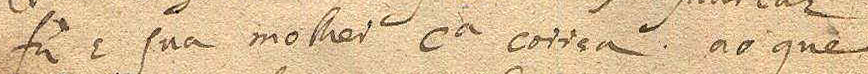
frz̄ E sua molher Ca correa ao que
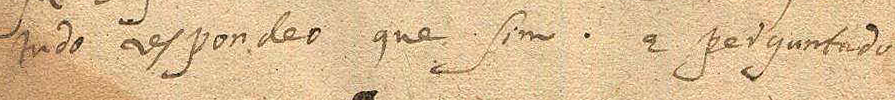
tudo respondeo que sim. E perguntado
